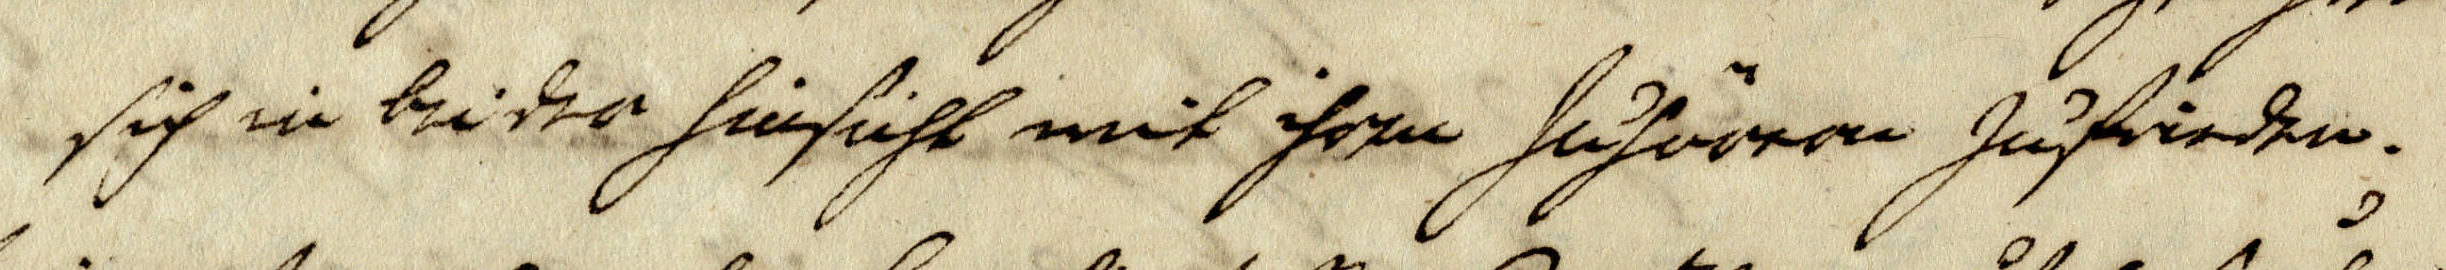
sich in beider Hinsicht mit ihren Zuhörern zufrieden.
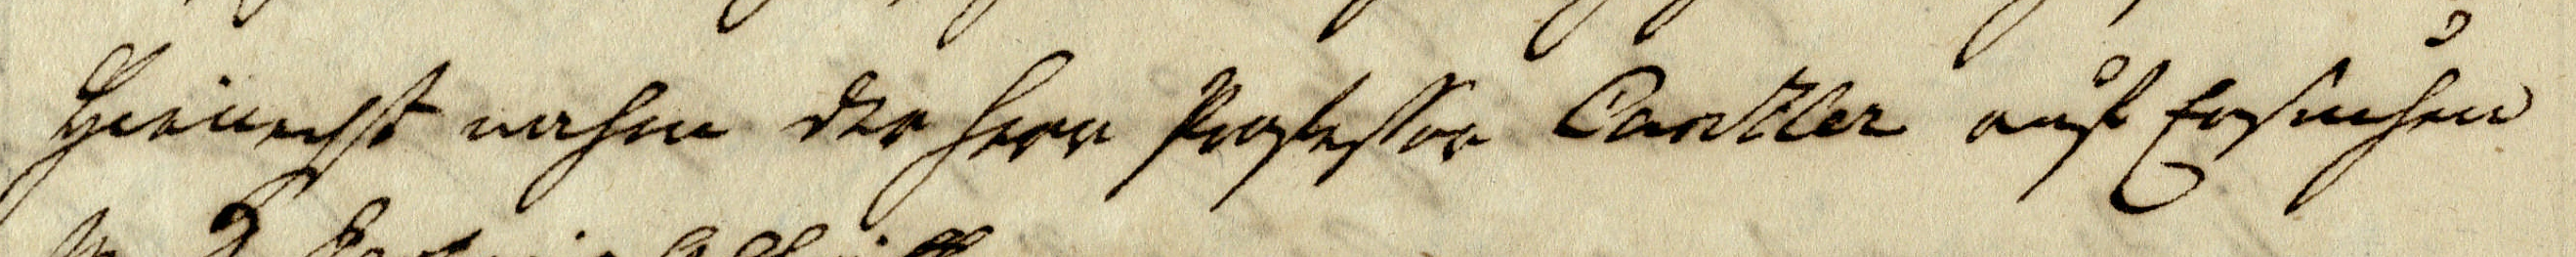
Hienechst nahm der Herr Professor Canzler auf Ersuchen
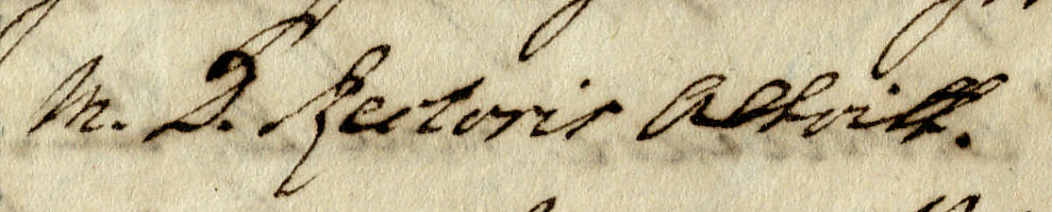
M. D. Rectoris Abtritt.
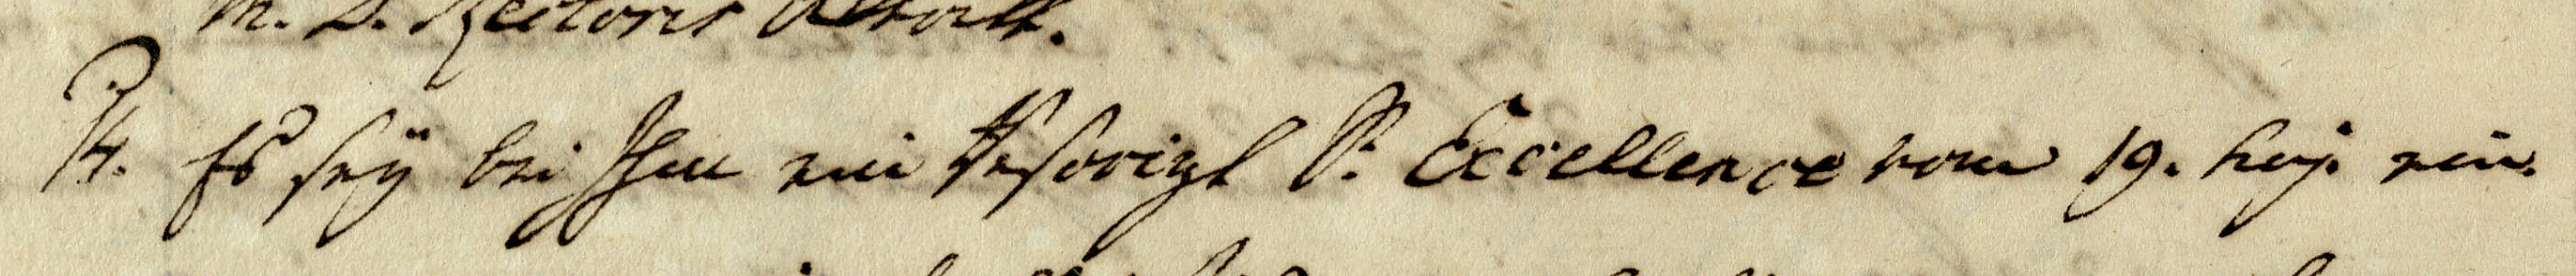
14. Es seÿ bei ihm ein Rescript Sr Excellence vom 19. huj. ein¬
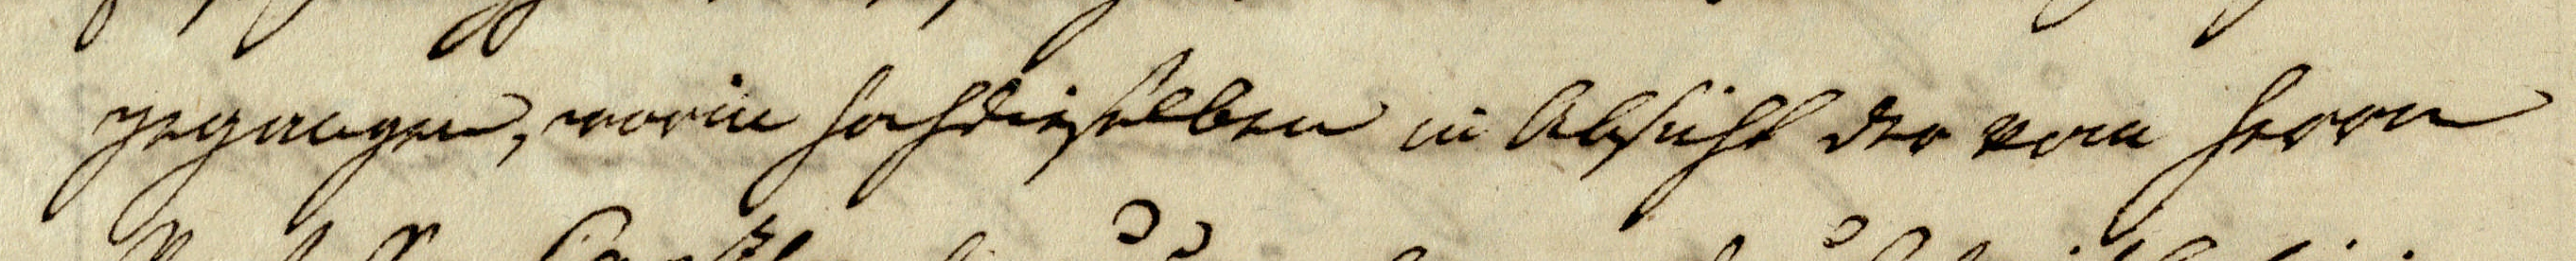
gegangen, worin Hochdieselben in Absicht der vom Herrn
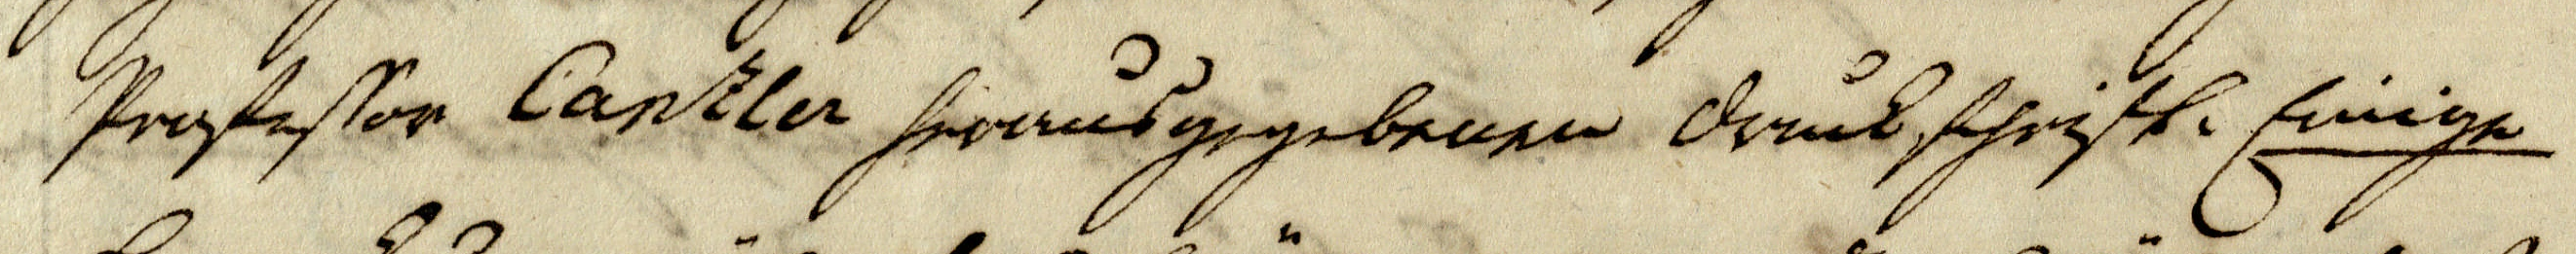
Professor Canzler herausgegebenen Druckschrift: Einige
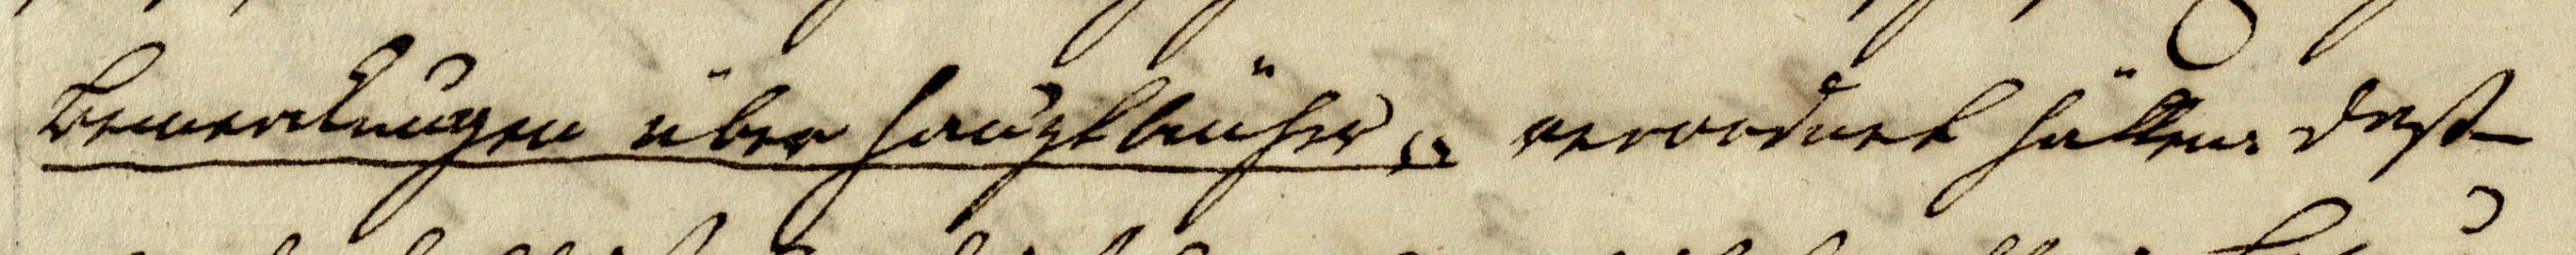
Bemerkungen über Hauptbücher verordnet hätten, daß
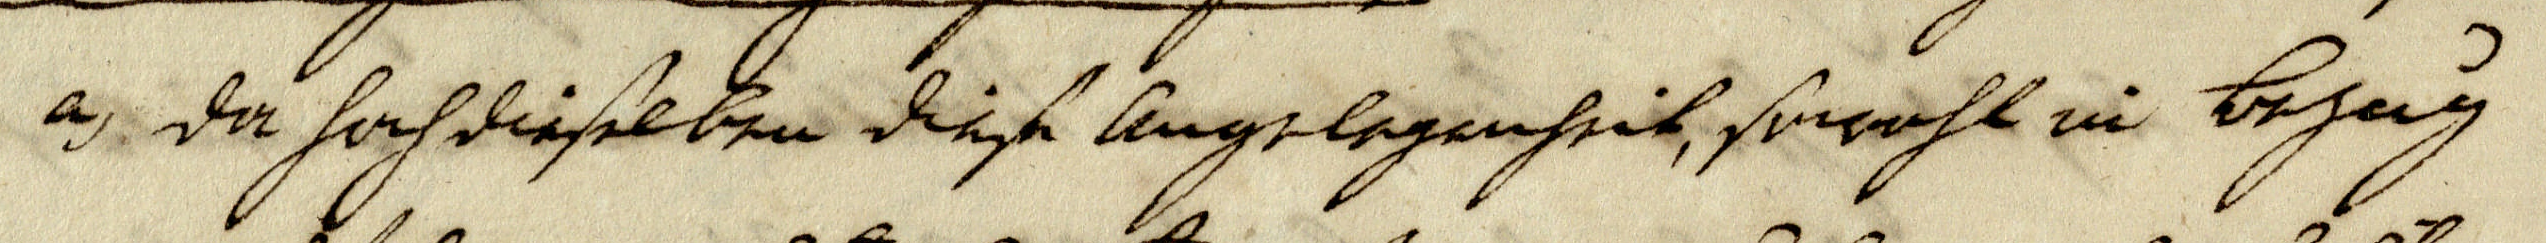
a, da Hochdieselben diese Angelegenheit, sowohl in Bezug
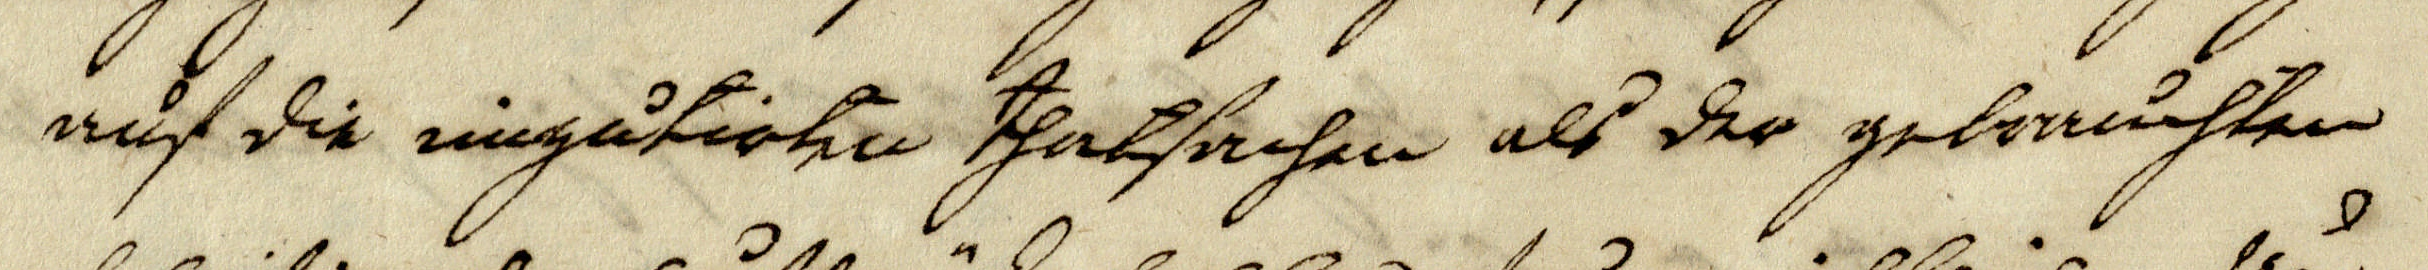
auf die imgutirten Thatsachen als der gebrauchten
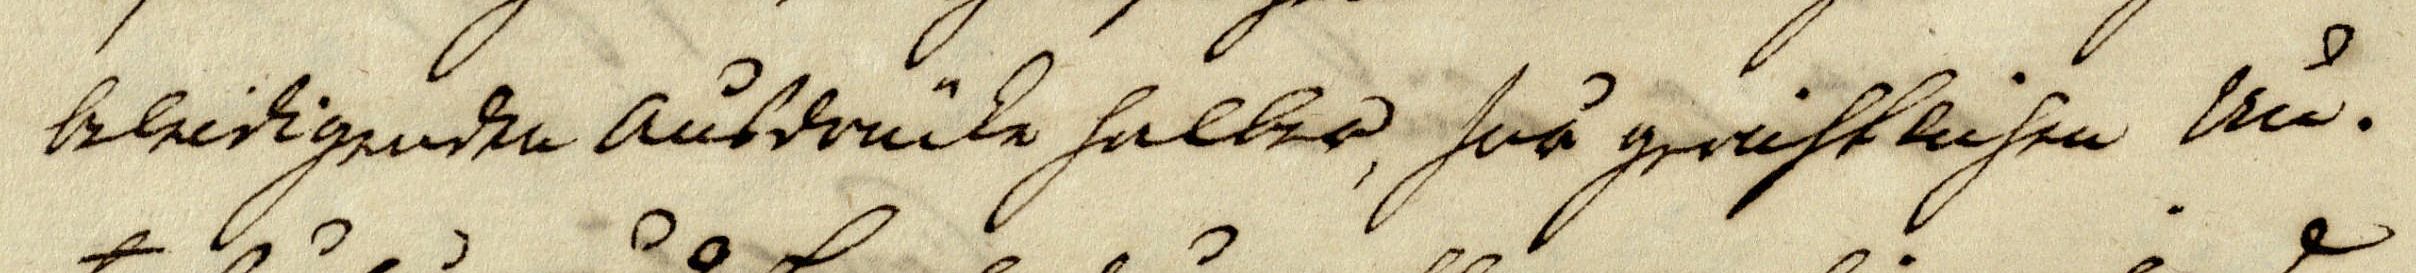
beleidigenden Ausdrücke halber, zur gerichtlichen Un¬
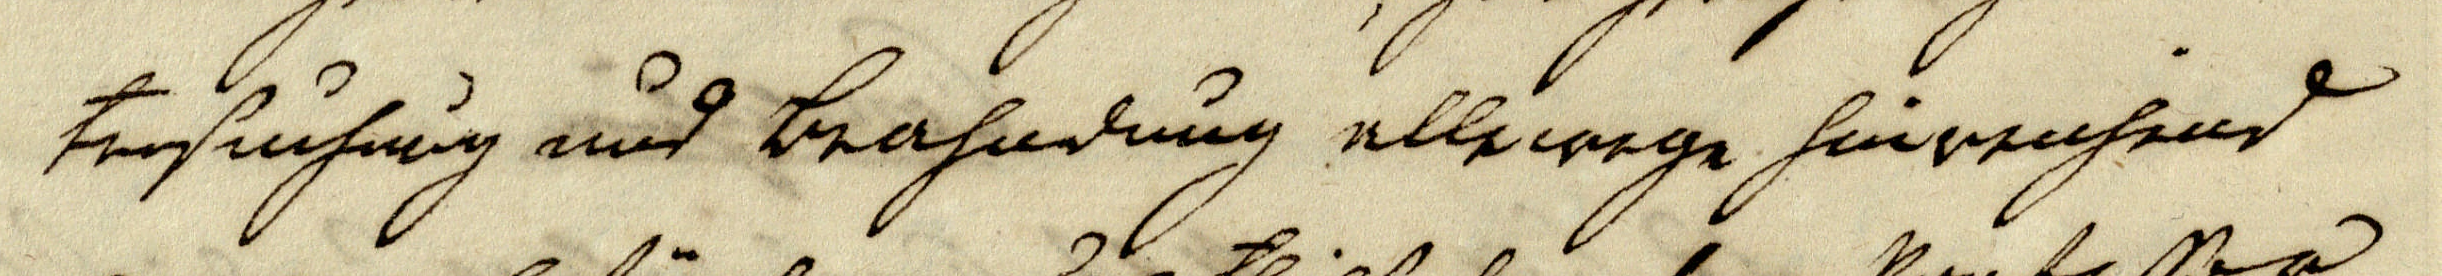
tersuchung und Beahndung allewege hinreichend
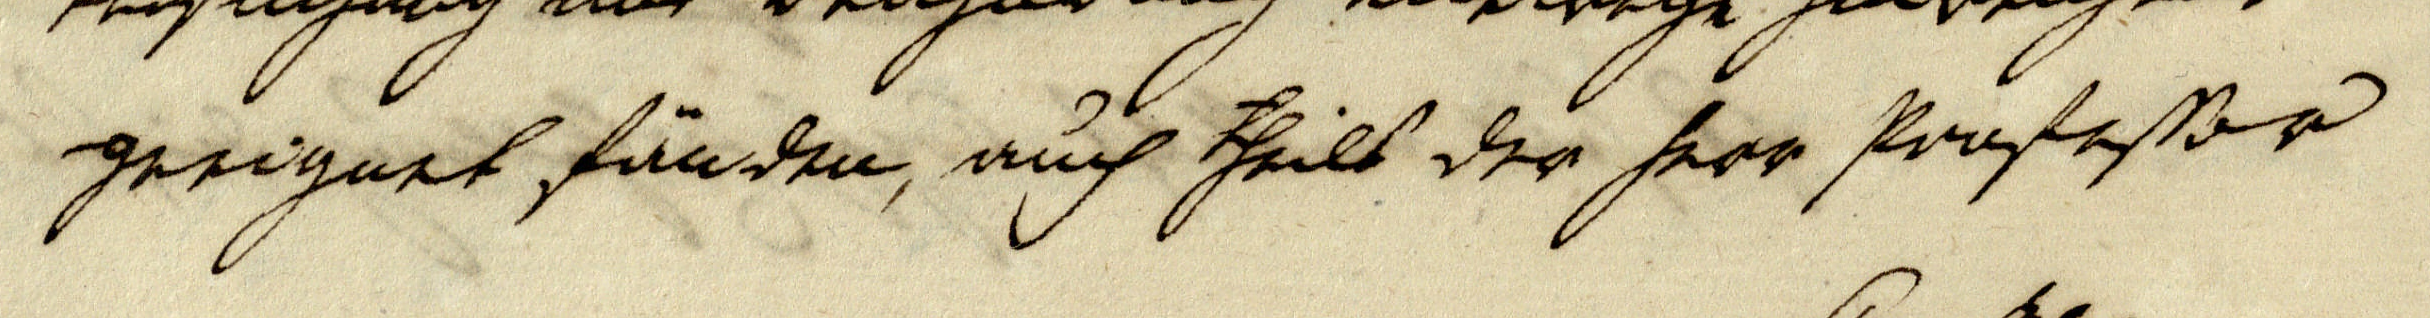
geeignet fänden, auch theils der Herr Professor
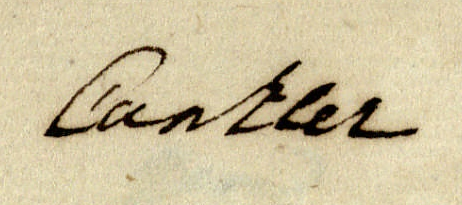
Canzler
